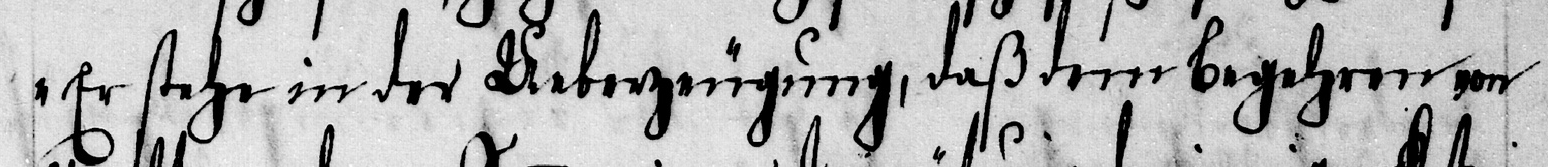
„Er stehe in der Ueberzeugung, daß dem Begehren von
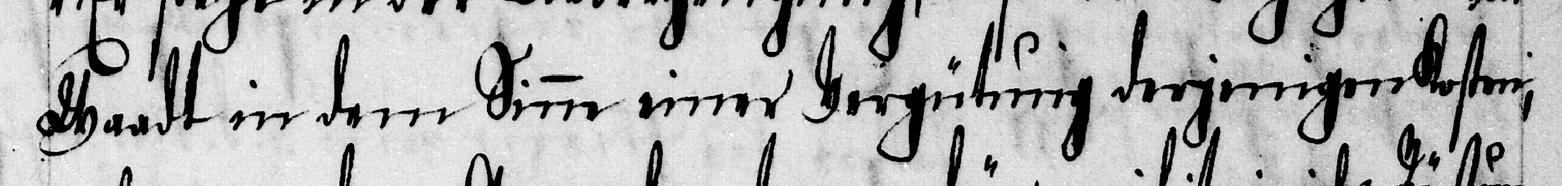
Waadt in dem Sinne einer Vergütung derjenigen Kosten,
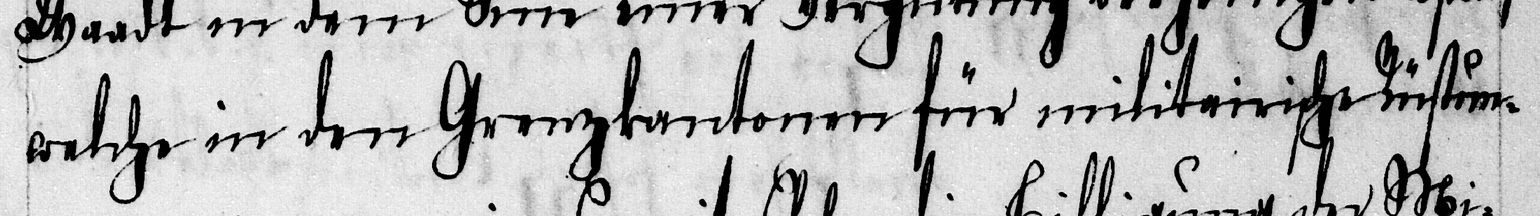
welche in den Grenzkantonen für militairische Rüstun¬
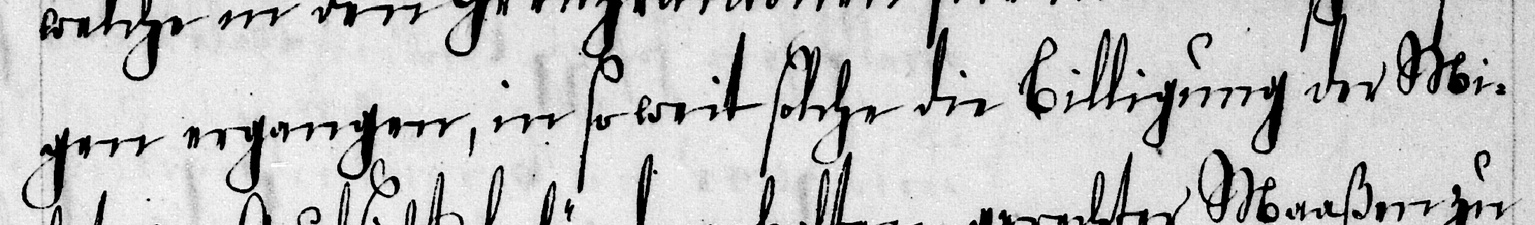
gen ergangen, in soweit solche die Billigung der Mi¬
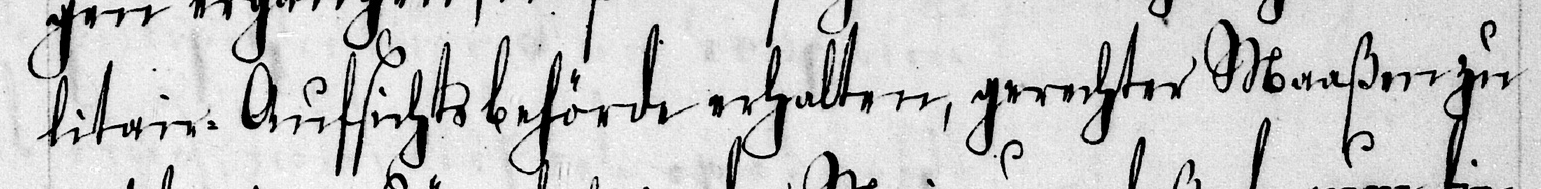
litair-Aufsichtsbehörde erhalten, gerechter Maaßen zu
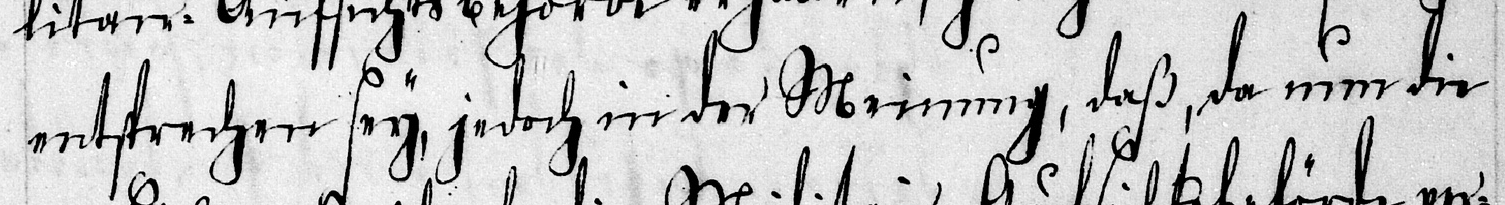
entsprechen sey, jedoch in der Meinung, daß, da nun die
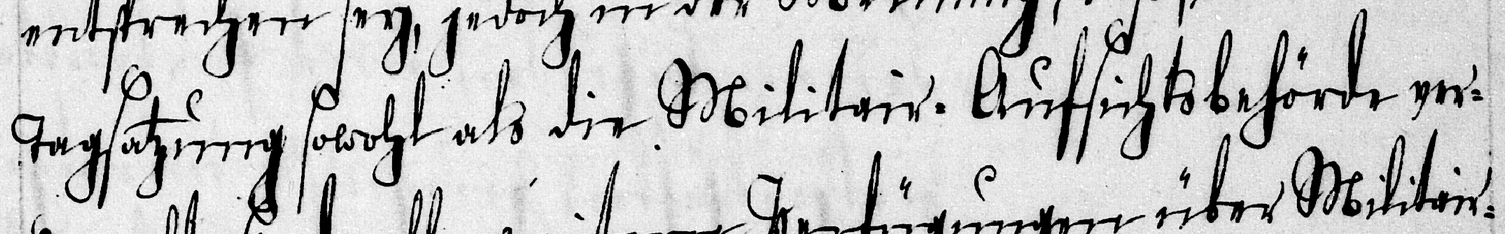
Tagsatzung sowohl als die Militair-Aufsichtsbehörde ver¬
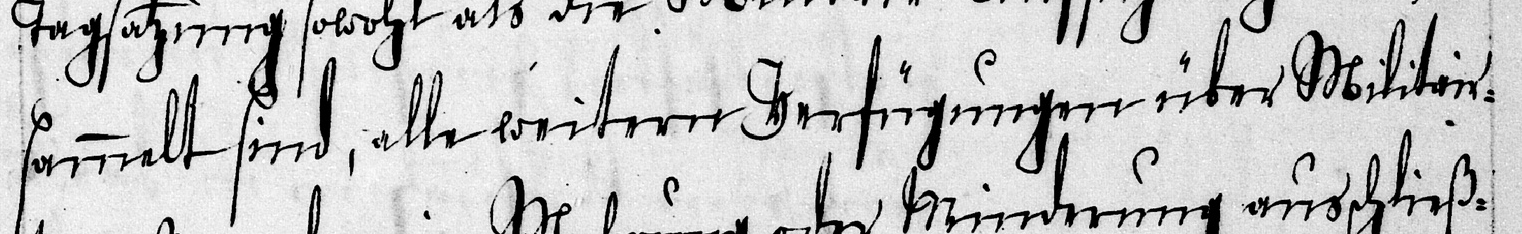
sammelt sind, alle weitern Verfügungen über Militai¬
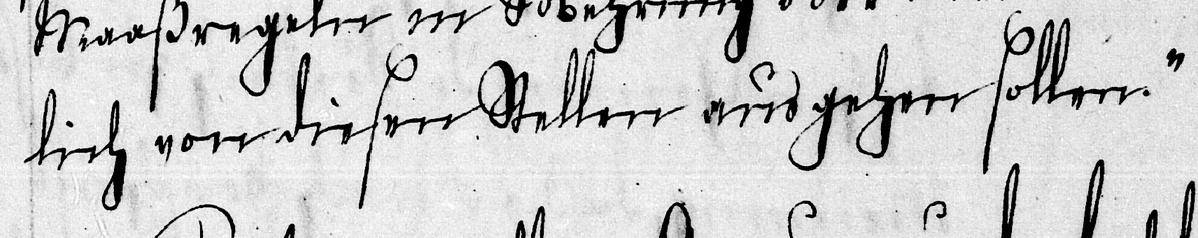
lich von diesen Stellen ausgehen sollen.“
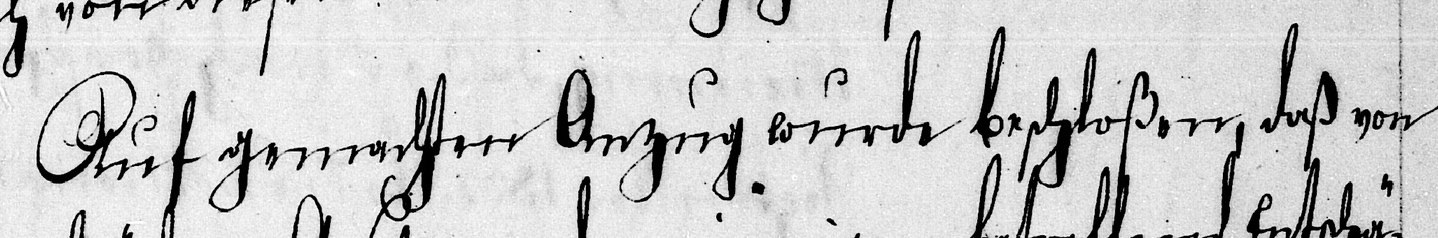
Auf gemachten Anzug wurde beschloßen, daß von
